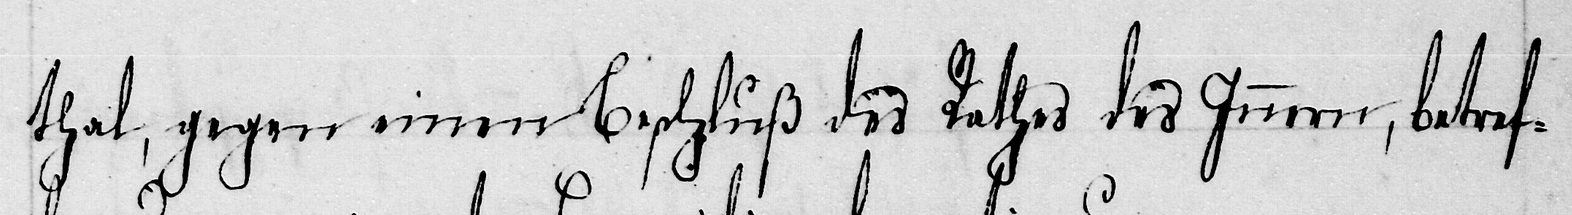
thal, gegen einen Beschluß des Rathes des Innern, betref¬
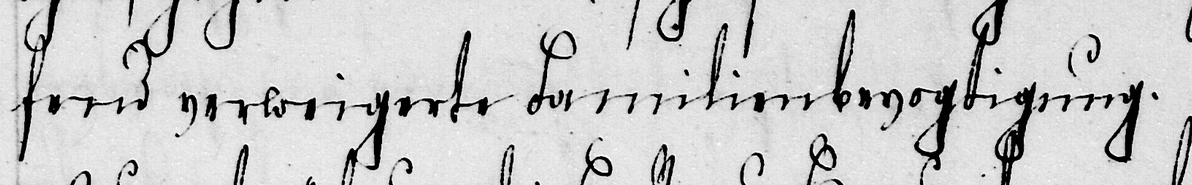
fend verweigerte Familienbevogtigung.
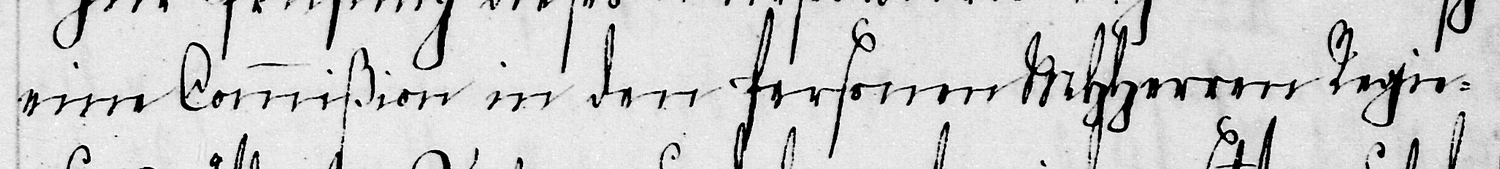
eine Commißion in den Personen MHHerren Regie¬
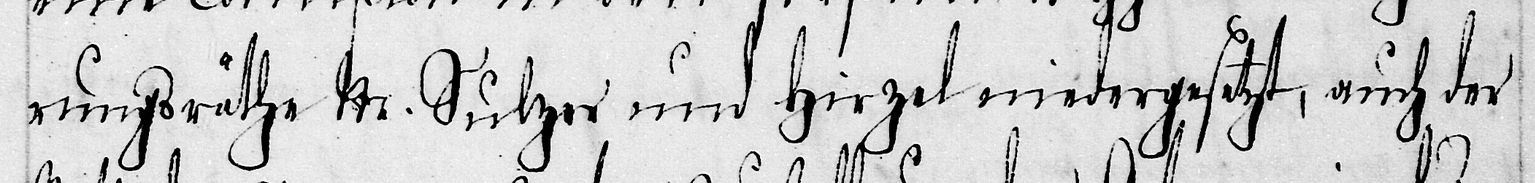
rungsräthe M. Sulzer und Hirzel niedergesetzt, auch der
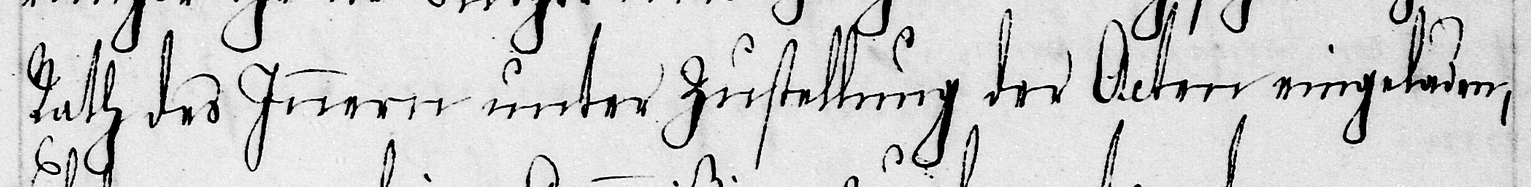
Rath des Innern unter Zustellung der Acten eingeladen,
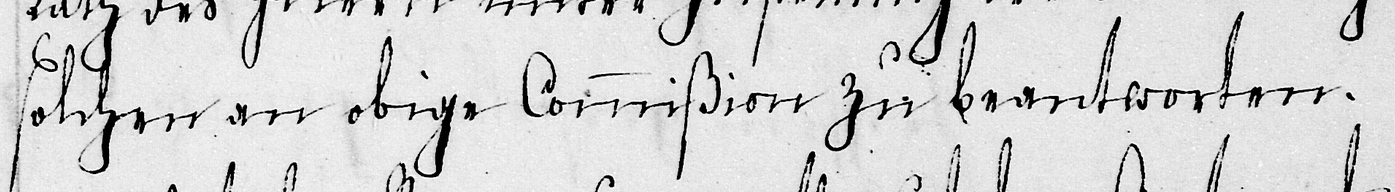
solchen an obige Commißion zu beantworten.
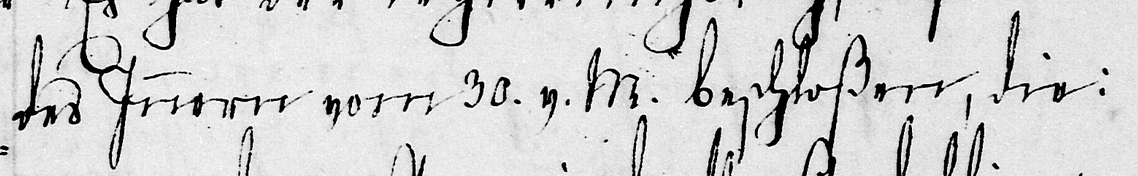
des Innern vom 30. v. M. beschloßen, die:
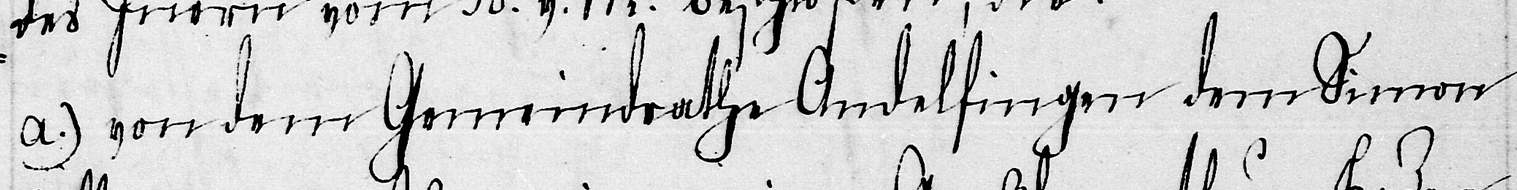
a.) von dem Gemeindrathe Andelfingen dem Simon
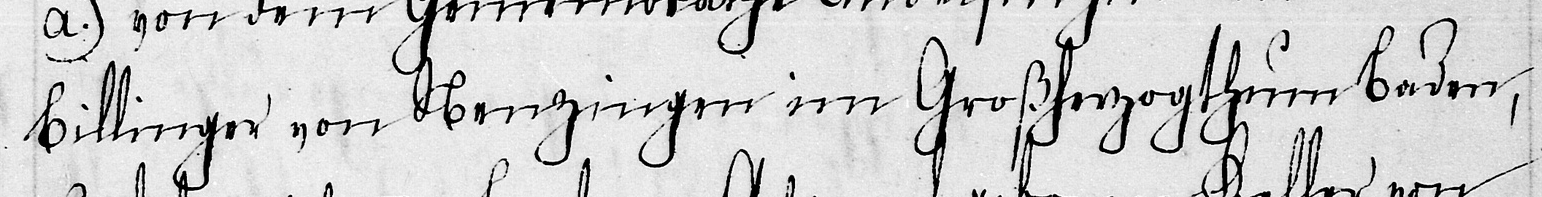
Billinger von Nenzingen im Großherzogthum Baden,
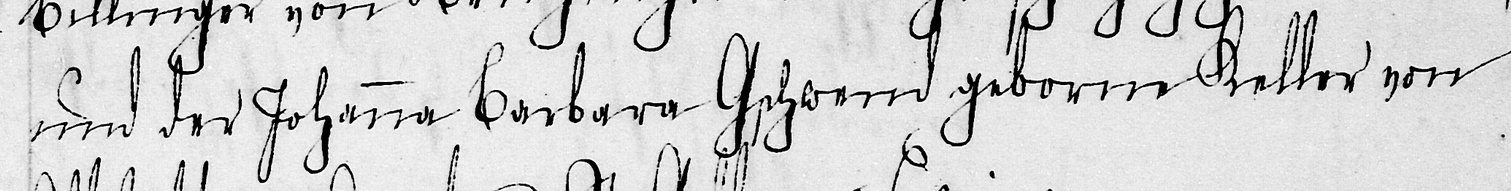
und der Johanna Barbara Gschwend geborne Keller von
